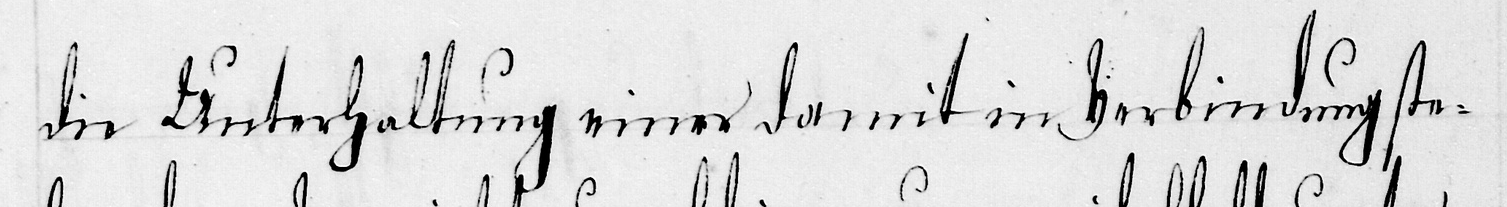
die Unterhaltung einer damit in Verbindung ste¬
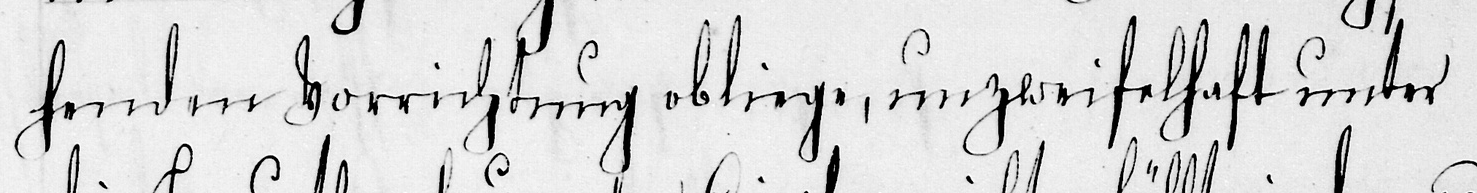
henden Vorrichtung obliege, unzweifelhaft unter
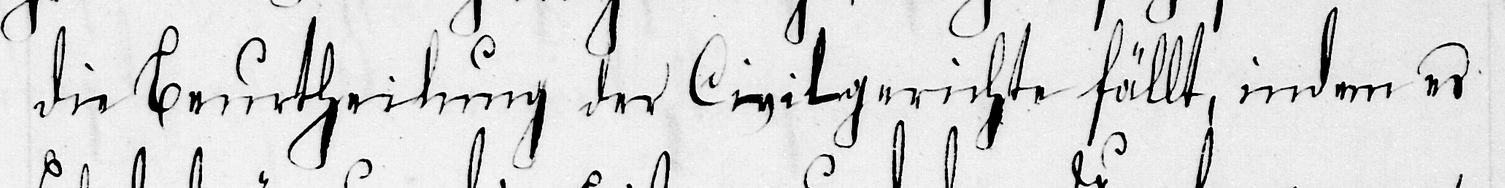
die Beurtheilung der Civilgerichte fällt, indem es
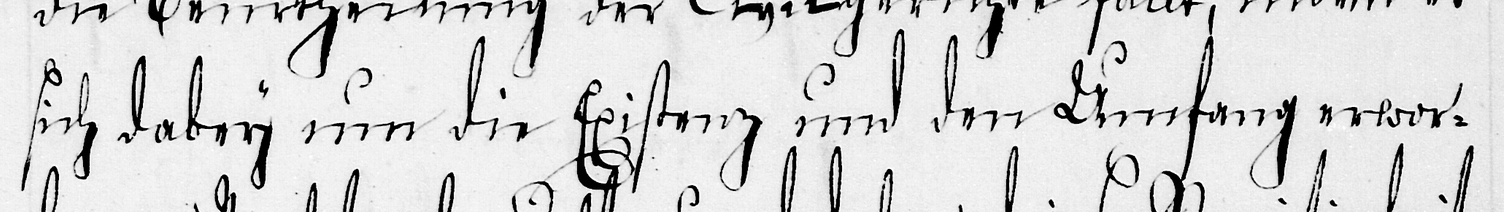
sich dabey um die Existenz und den Umfang erwor¬
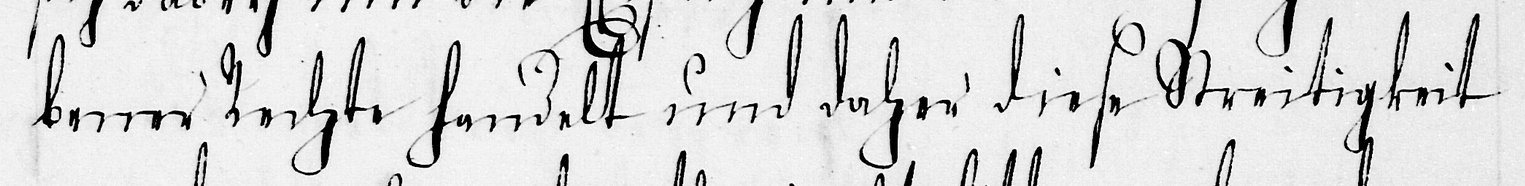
bener Rechte handelt und daher diese Streitigkeit
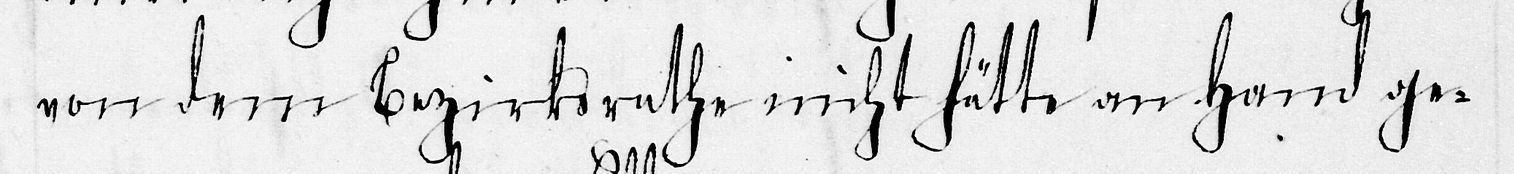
von dem Bezirksrathe nicht hätte an Hand ge¬
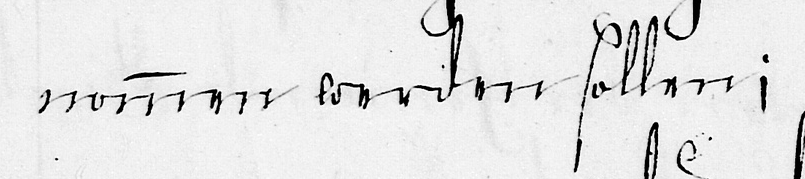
nommen werden sollen;
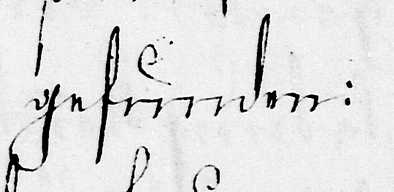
gefunden:
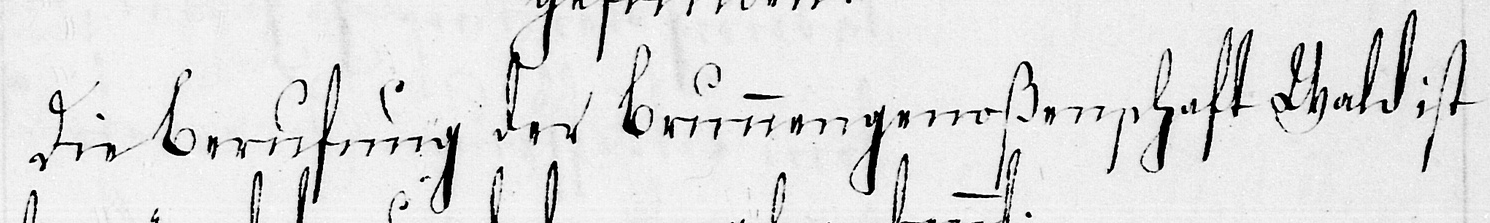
Die Berufung der Brunnengenoßenschaft Wald ist
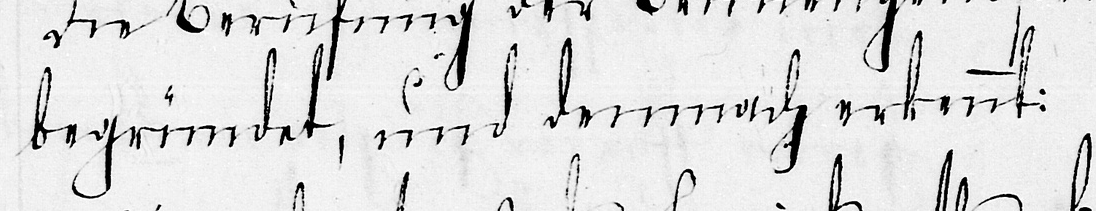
begründet, und demnach erkennt:
